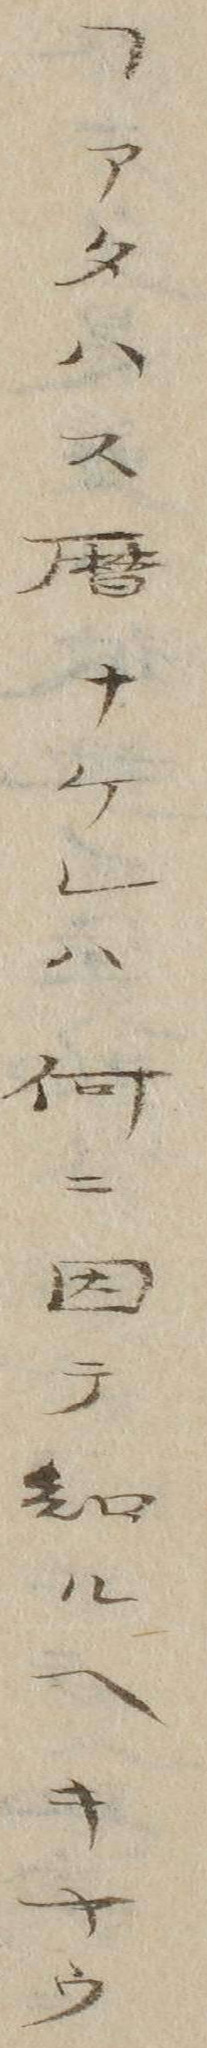ヿアタハス暦ナケレハ何ニ因テ知ルヘキヤウ
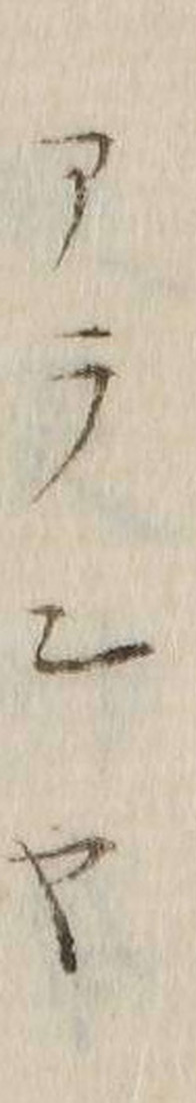アランヤ
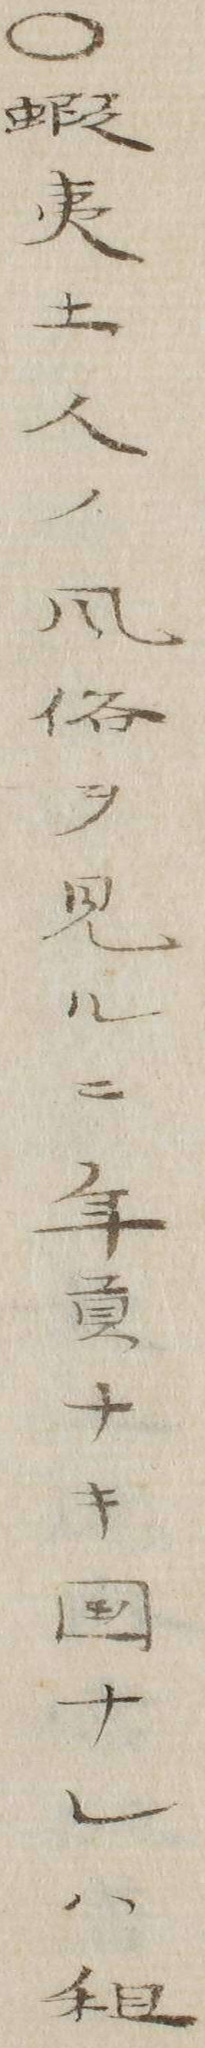〇蝦夷土人ノ風俗ヲ見ルニ年貢ナキ国ナレハ租
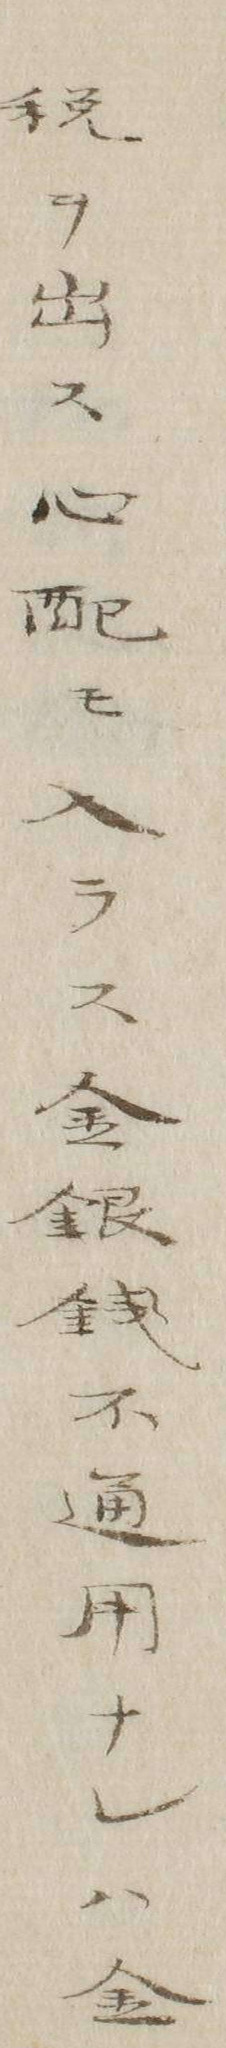税ヲ出ス心配モ入ラス金銀銭不通用ナレハ金
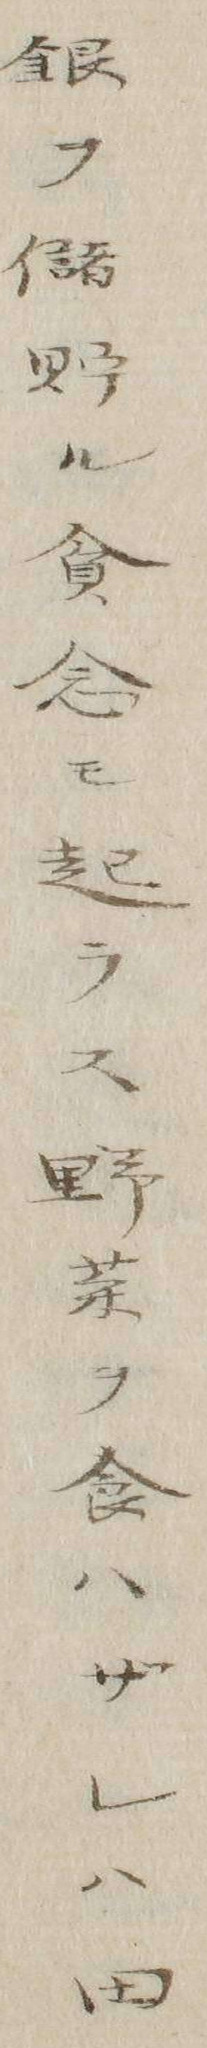銀ヲ儲貯ル貪念モ起ラス野菜ヲ食ハザレハ田
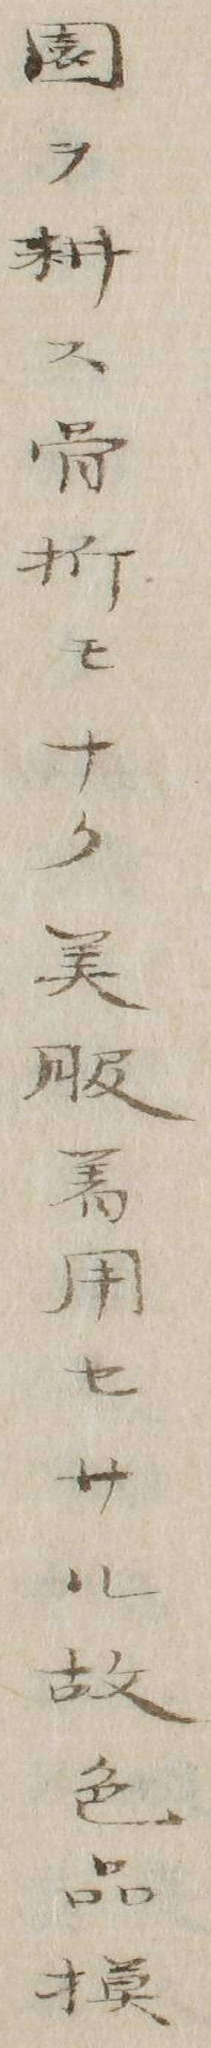園ヲ耕ス骨折モナク美服着用セサル故色品模
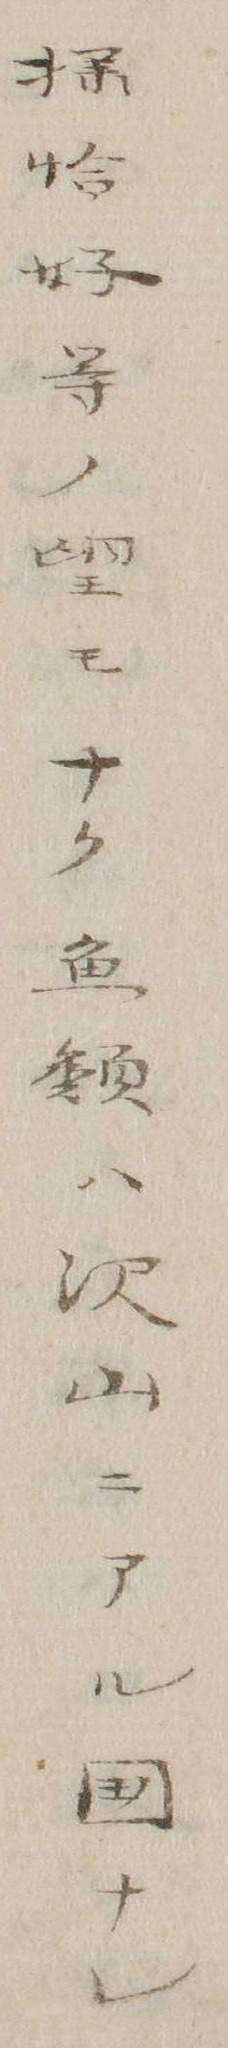様恰好等ノ望モナク魚類ハ沢山ニアル国ナレ
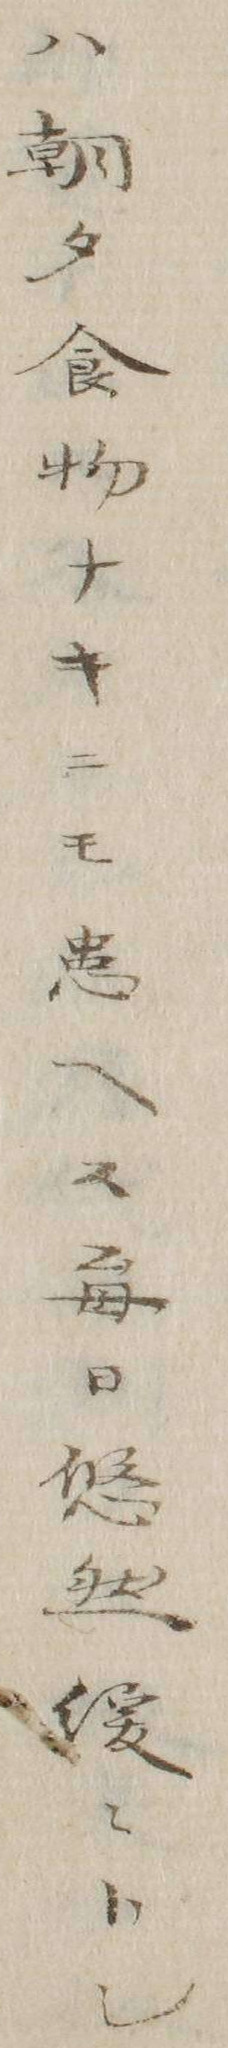ハ朝夕食物ナキニモ患ヘス毎日悠然緩々トシ
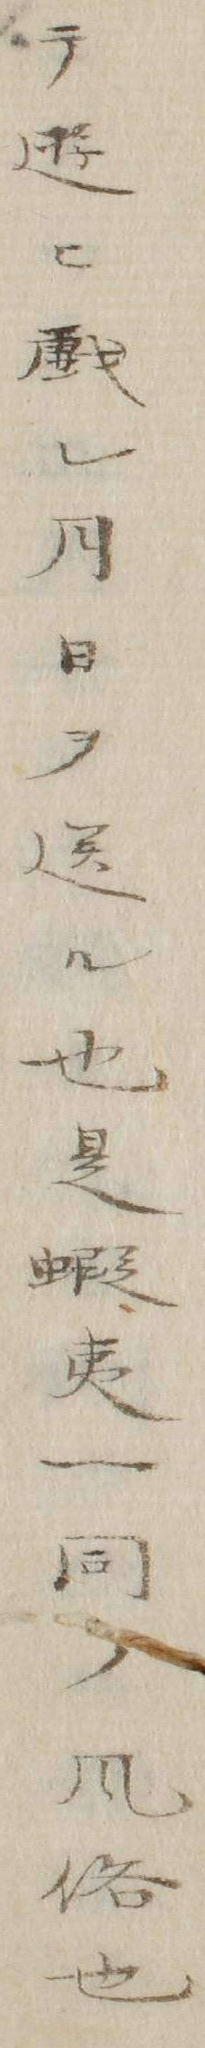テ遊ヒ戯レ月日ヲ送ル也是蝦夷一同ノ風俗也

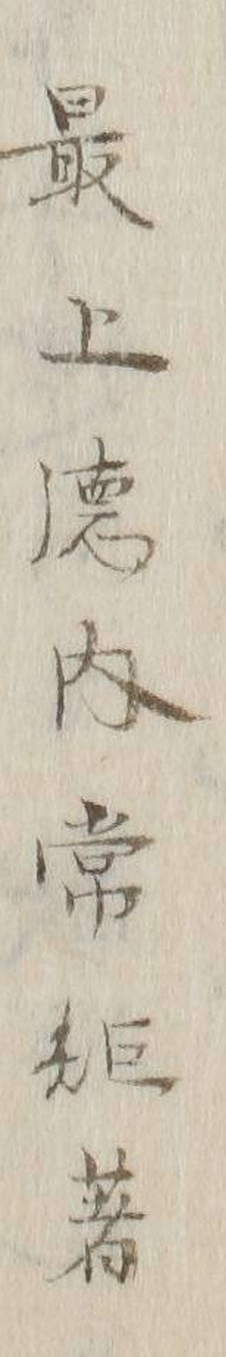最上徳内常矩著
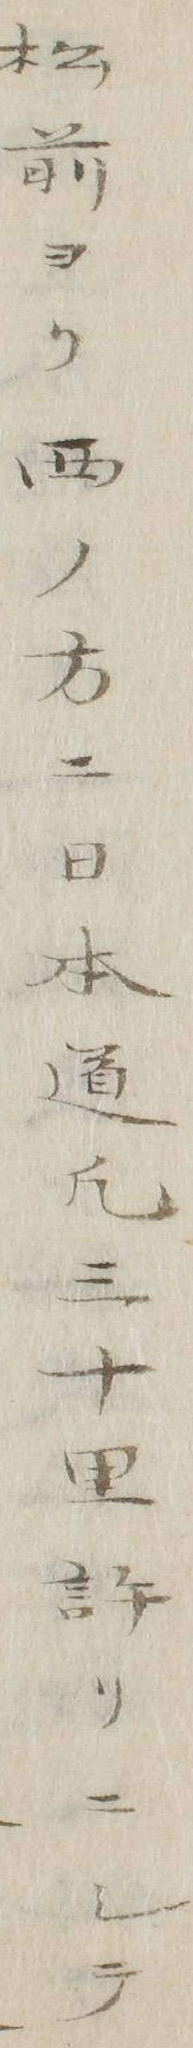松前ヨリ西ノ方ニ日本道凡三十里許リニシテ
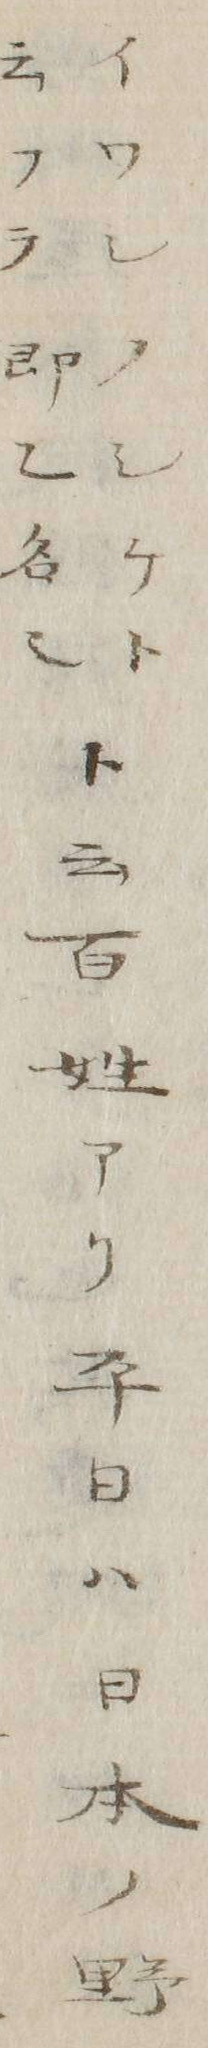イワシノシケ云フテ即乙名也ト云百姓アリ平日ハ日本ノ野
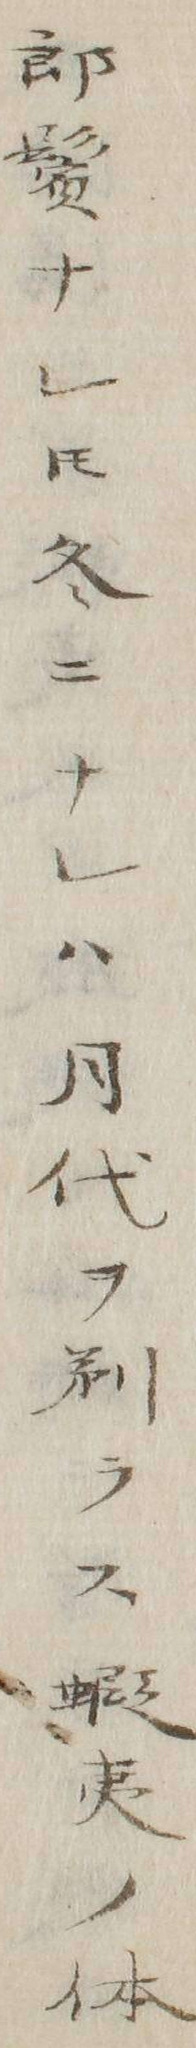郎鬢ナレ𪜈冬ニナレハ月代ヲ剃ラス蝦夷ノ体
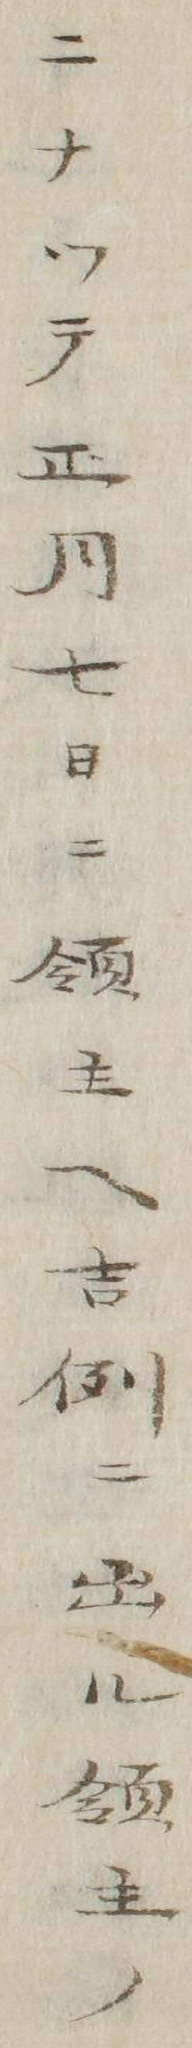ニナツテ正月七日ニ領主ヘ吉例ニ出ル領主ノ
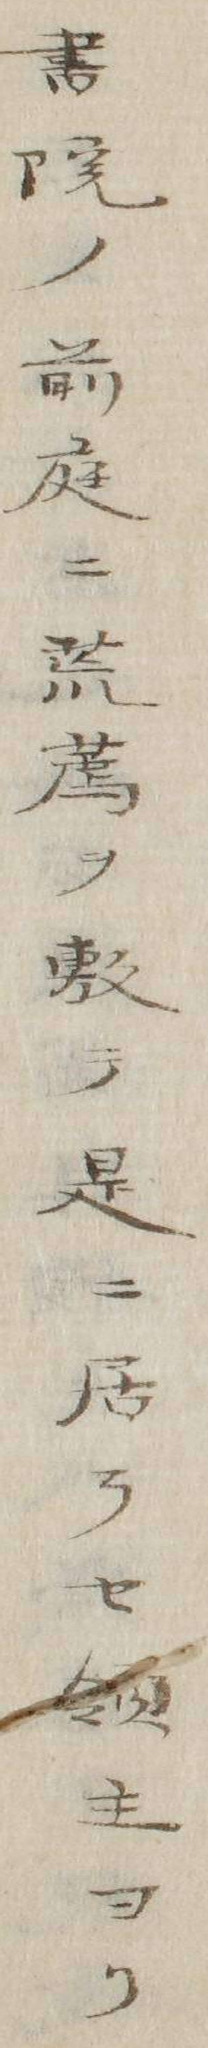書院ノ前庭ニ荒薦ヲ敷テ是ニ居ラセ領主ヨリ
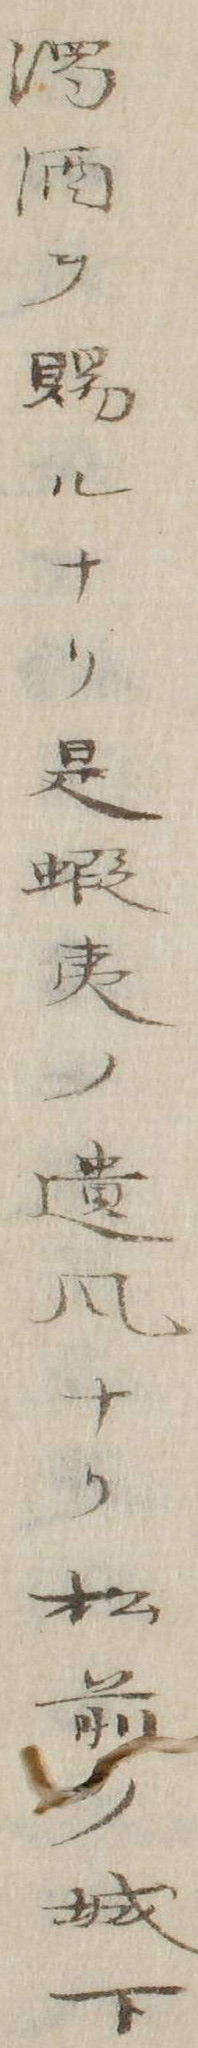濁酒ヲ賜ルナリ是蝦夷ノ遺風ナリ松前ノ城下
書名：蝦夷草紙（国文学研究資料館）
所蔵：国文学研究資料館
